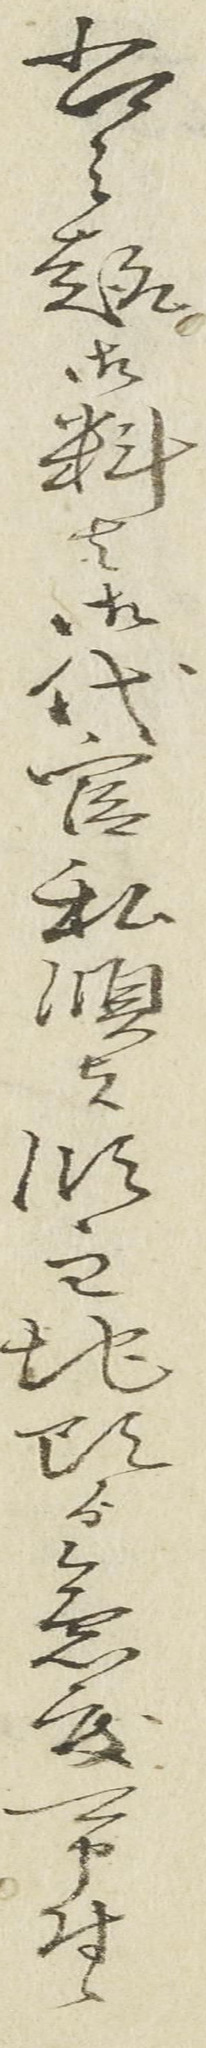右之趣御料は御代官私領は領主地頭ゟ急度可申付候
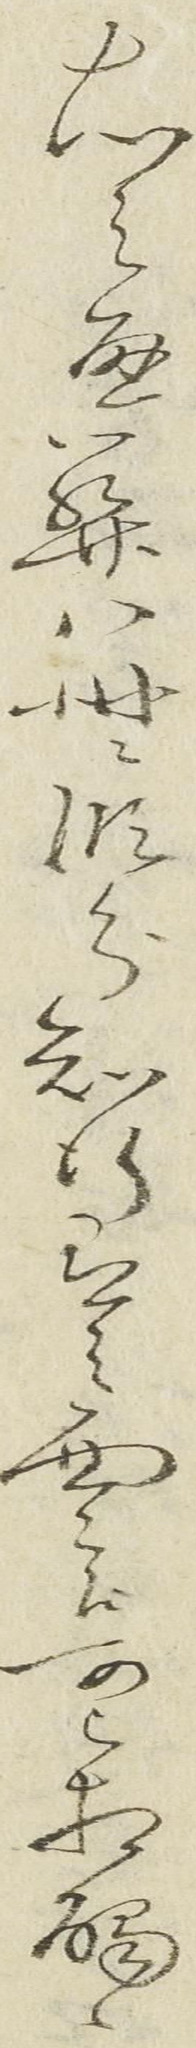右之通関八州ニ領分知行有之面々え可被相触候
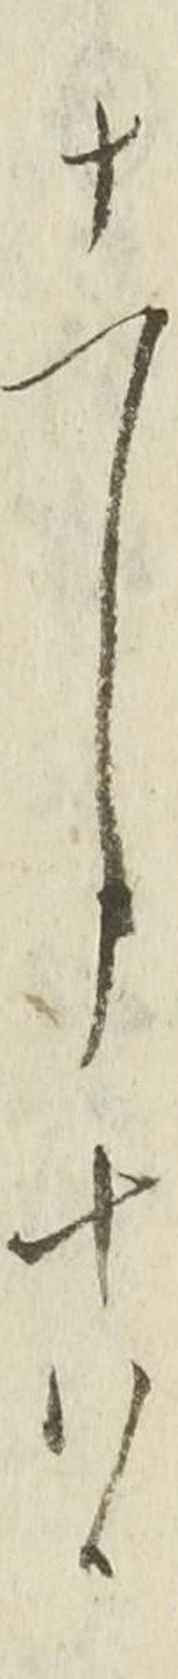十一月十八日
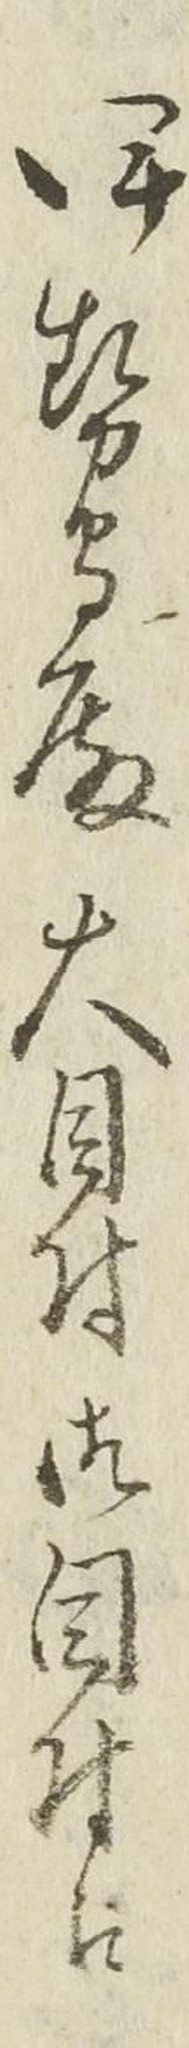伊勢守殿大目付御目付え
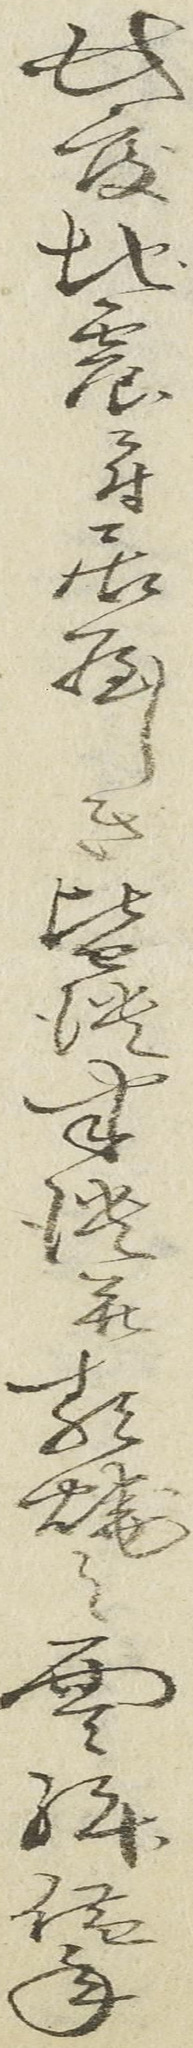此度地震二付居屋しき皆潰半潰幷類焼之面々拝借年
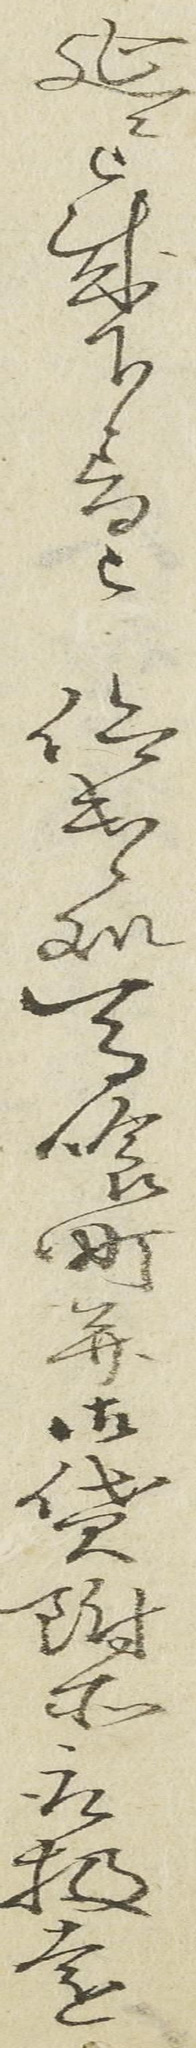延ニ被成下旨被仰出候処馬喰町幷御貸附所取扱遠
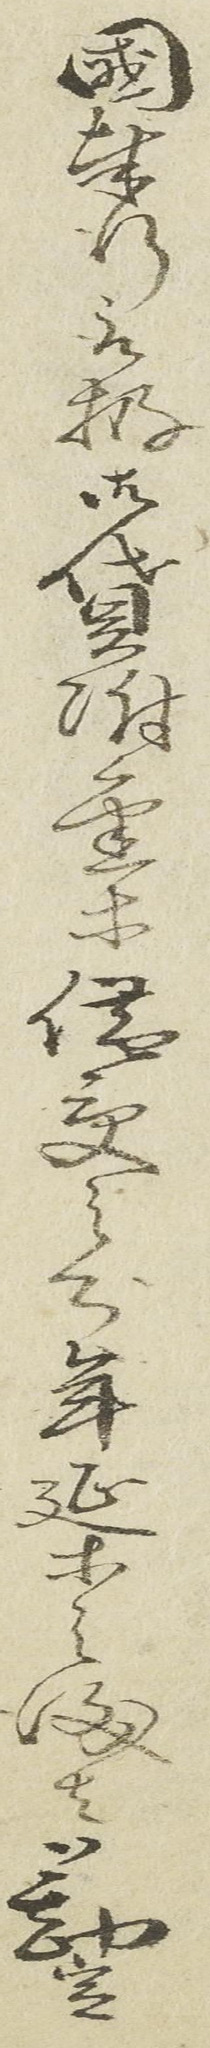国奉行取扱御貸附金等借受之分年延等之儀は御勘定
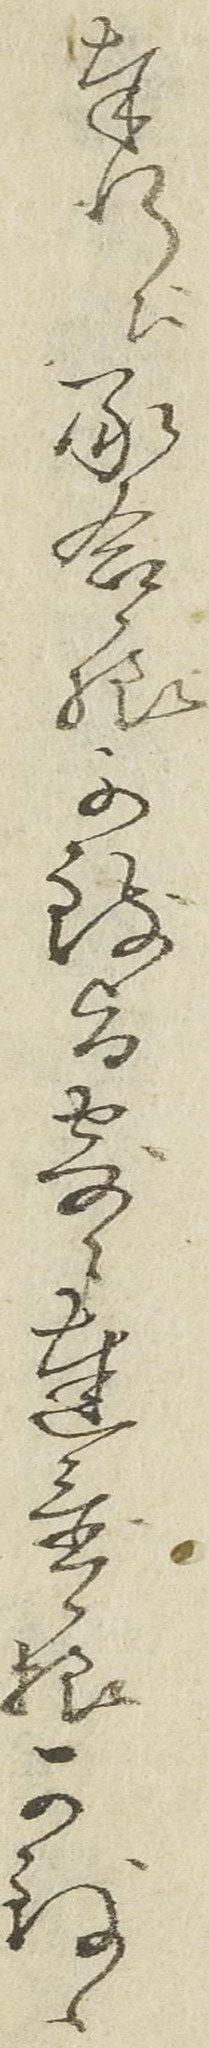奉行え承合候様可致旨寄々達置候様可致候

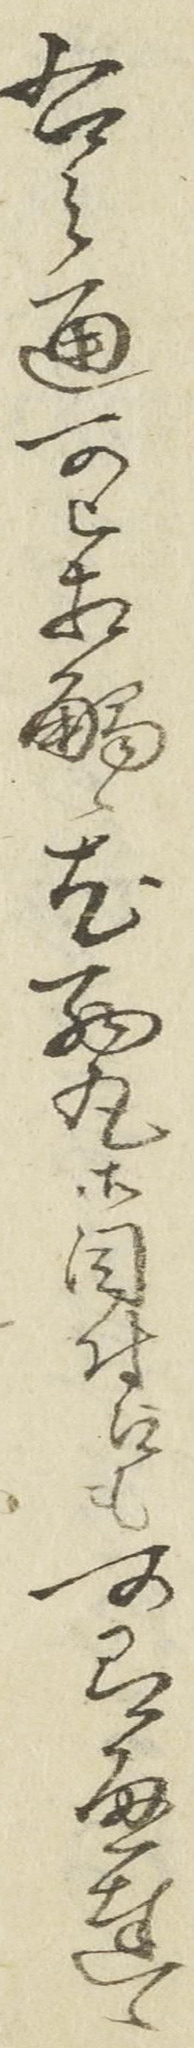右之通可被相触候尤西丸御目付えも可有通達候
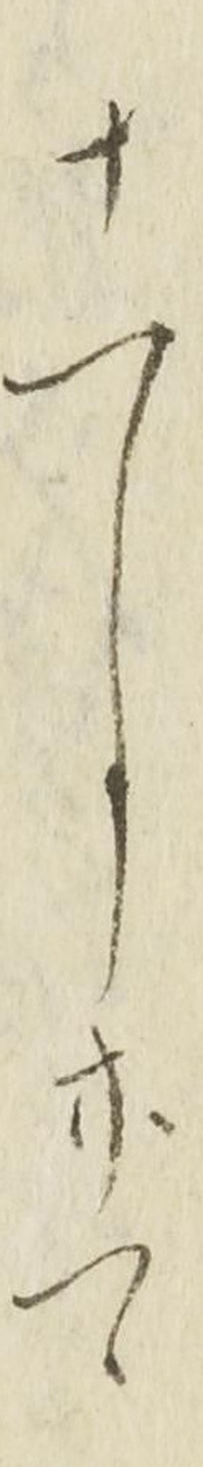十一月廿一日
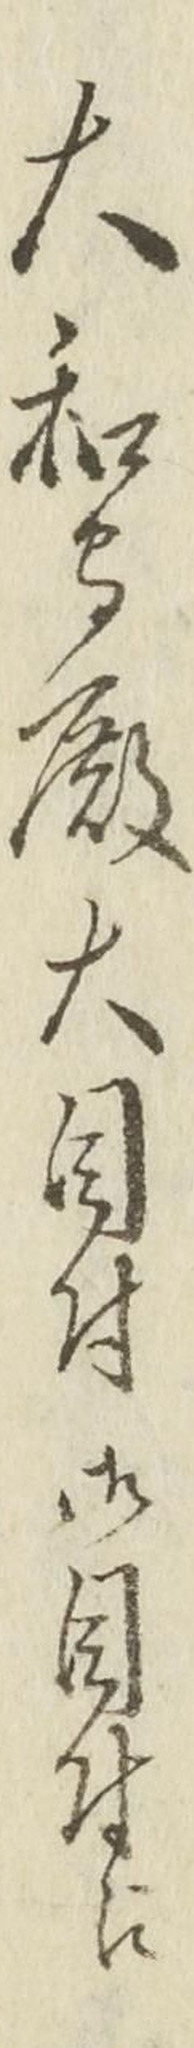大和守殿大目付御目付え
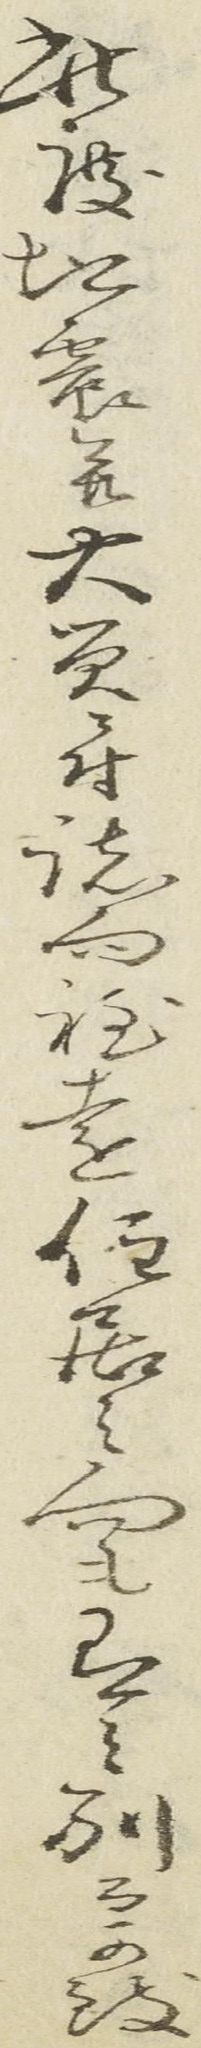此度地震并火災に付諸向程遠住居之向も有之別而可致
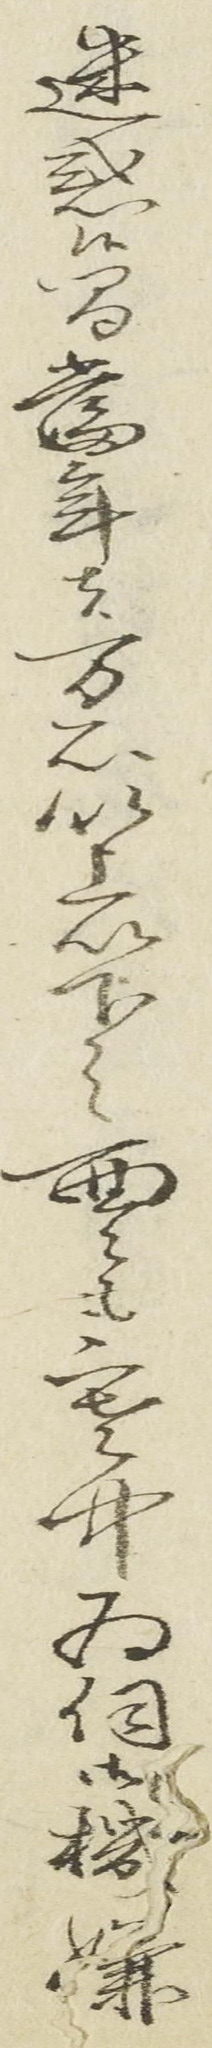迷惑候間当年は万石以上以下之面々も寒中為伺御機嫌
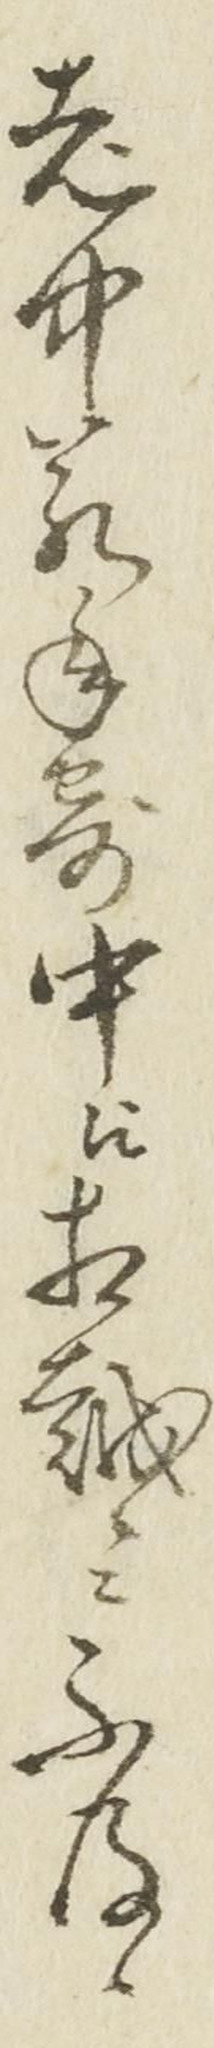老中若年寄中え相越候ニ不及候
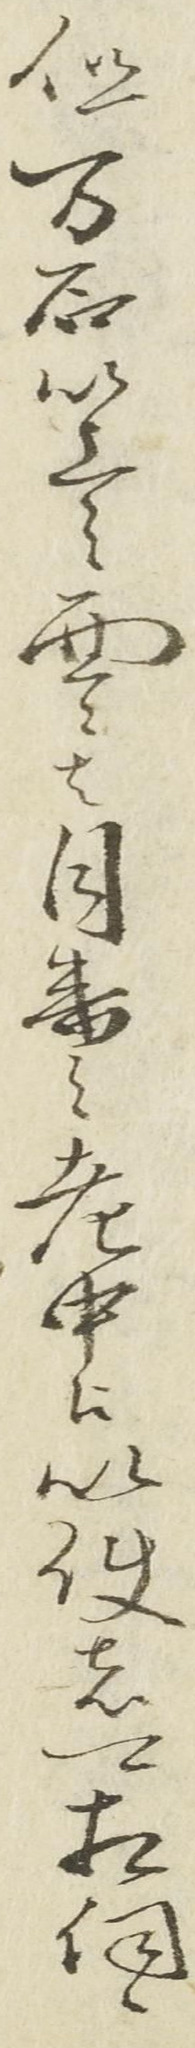但万石以上之面々は月番之老中え以使者可相伺候
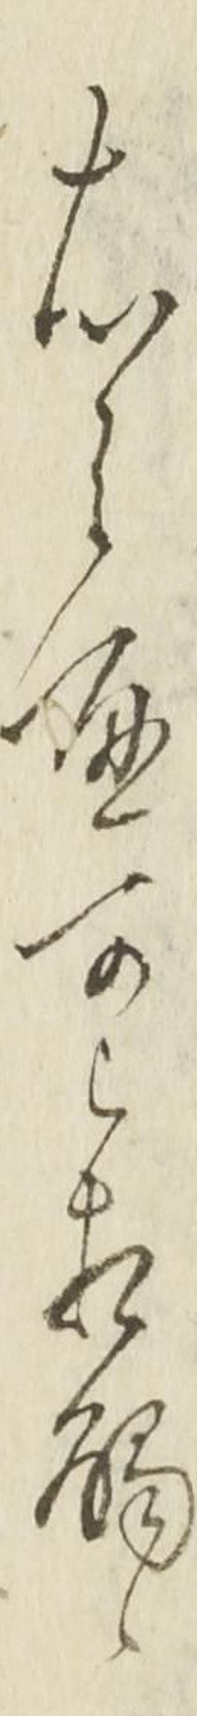右之通可被相触候
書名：安政二乙卯年十月二日大地震之事
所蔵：東京大学地震研究所図書室 Earthquake Research Institute Library, The University of Tokyo, JAPAN
